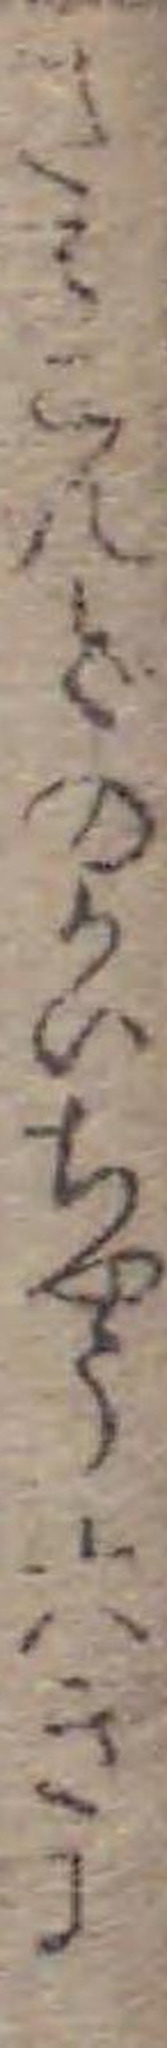さてこんどのかいちやう大きに
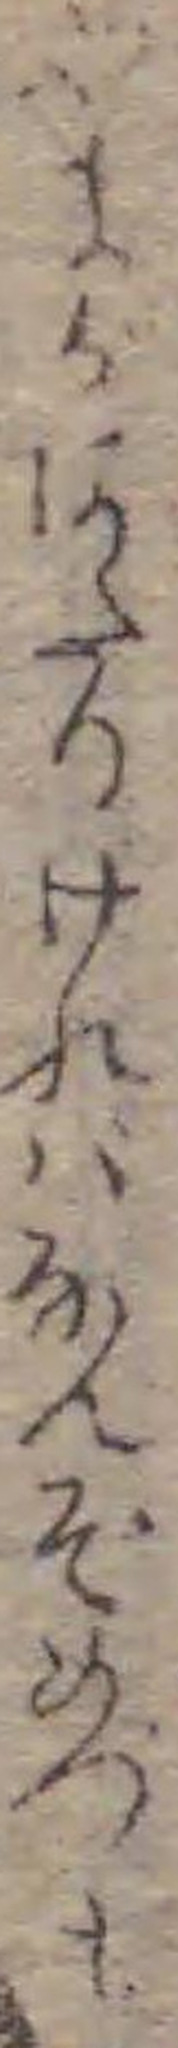やまがあたりければなんぞめづ
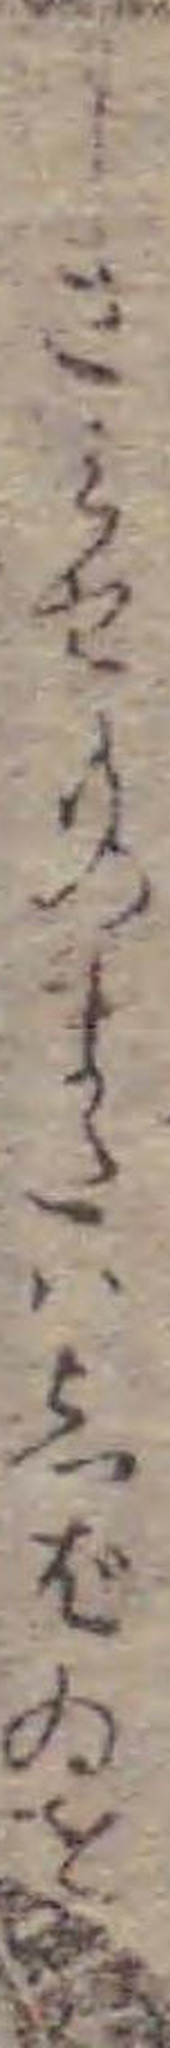しきみせものまたはしばゐを
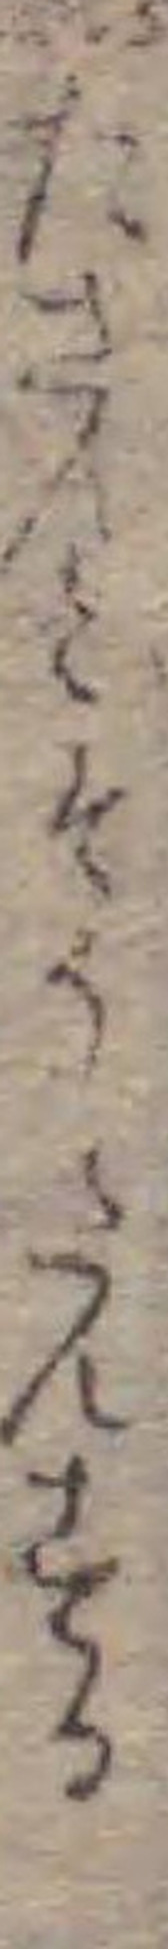たさんとそうたんする
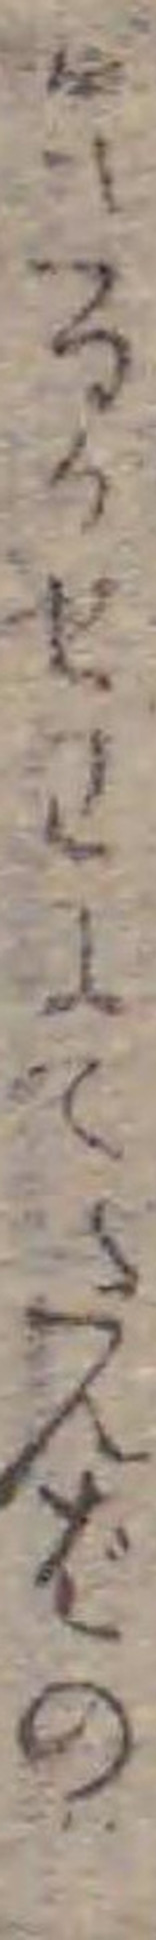さるかせわにてたんばの
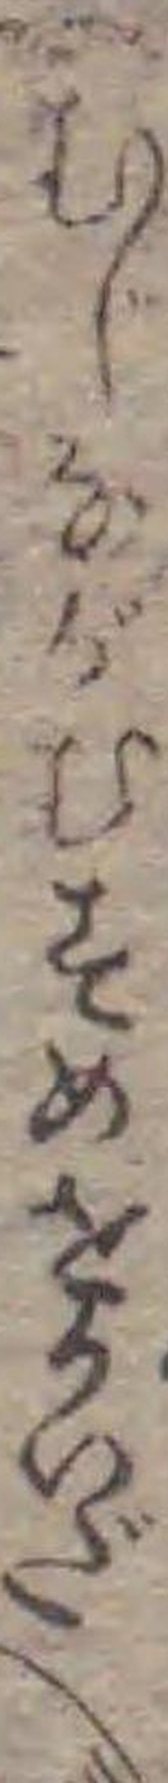むじながむすめをかいだ
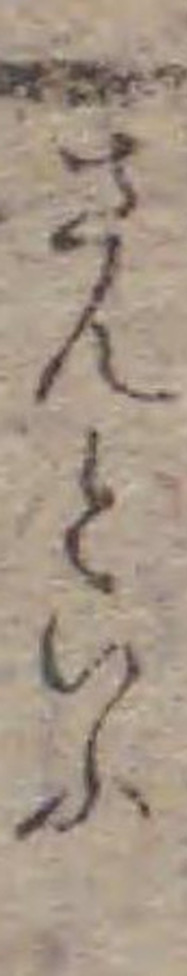さんといふ
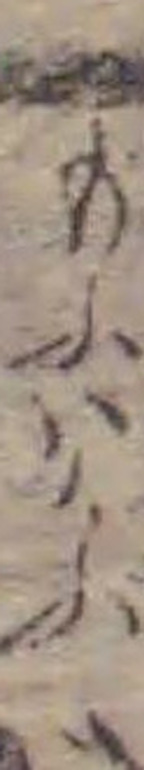もふはかふ
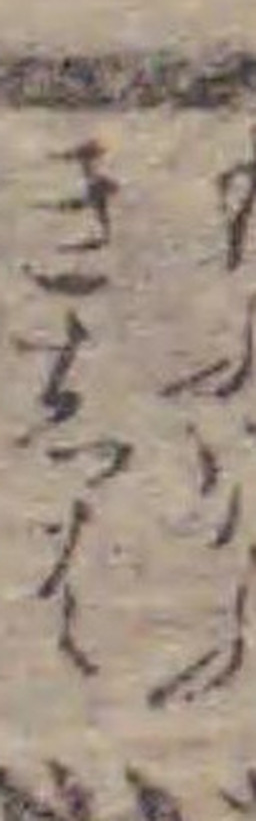きしは
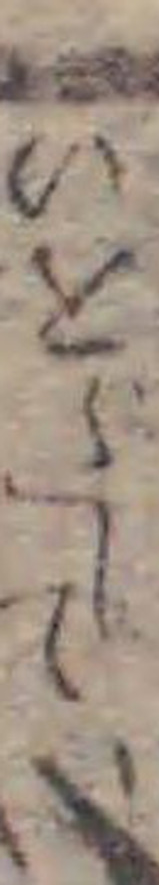いをたして
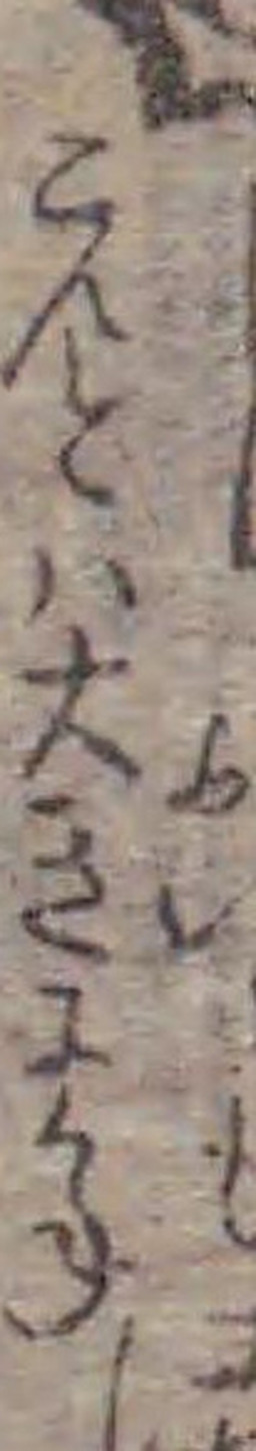こんとは大きにかね
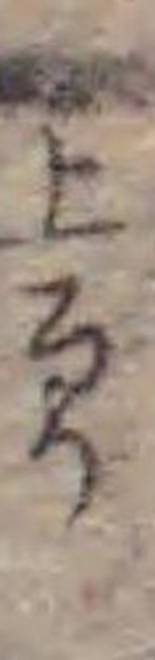上るり
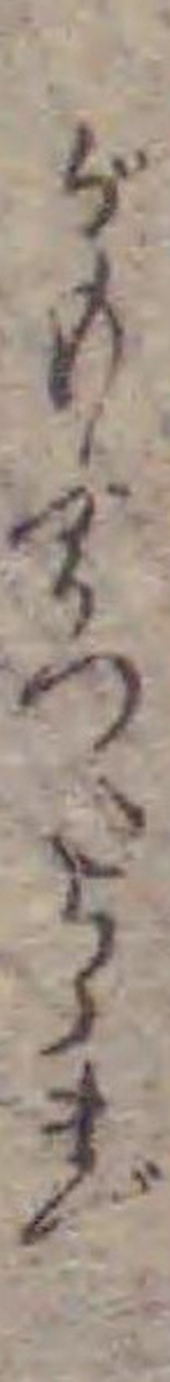がもふかつたからま
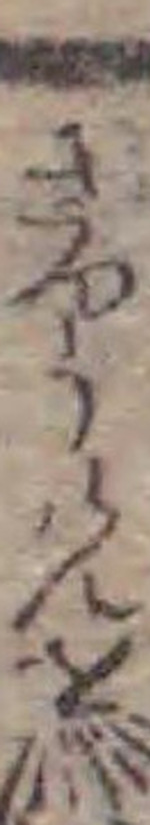きやうけんを
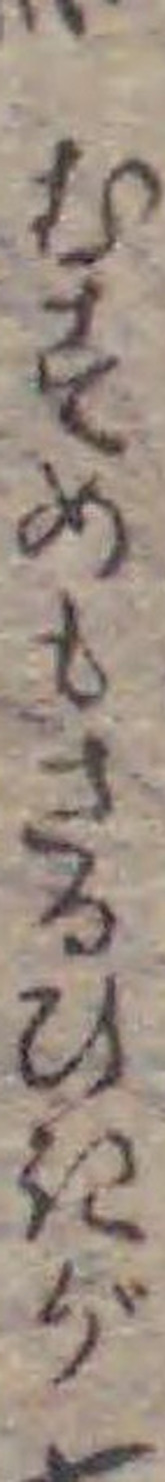むすめもさるひきが
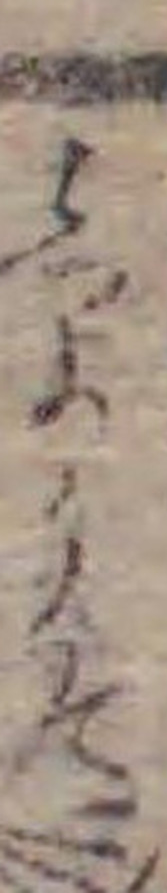しようそ
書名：化物七段目 : 2巻
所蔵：国立国会図書館 National Diet Library, JAPAN
